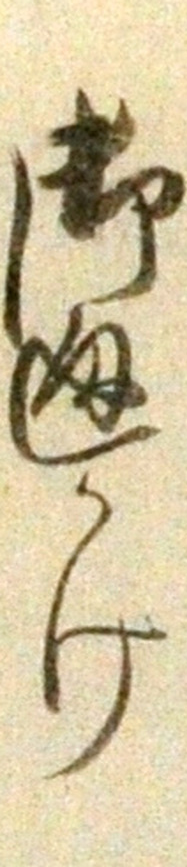御通かけ
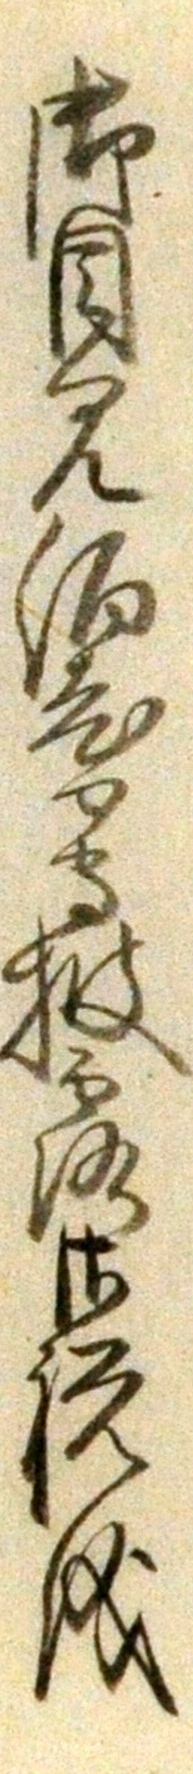御目見伯耆守披露御祝儀
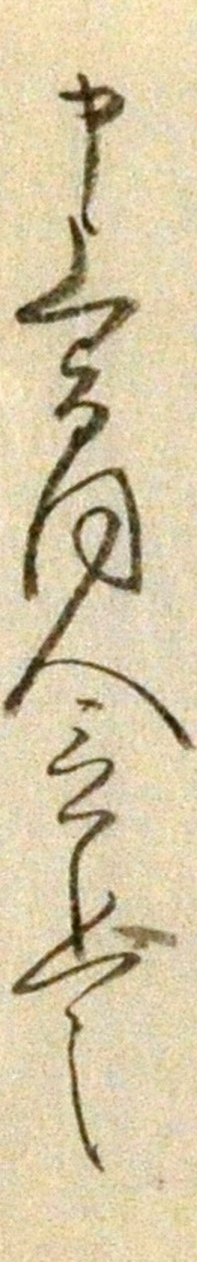申上旨同人言上之
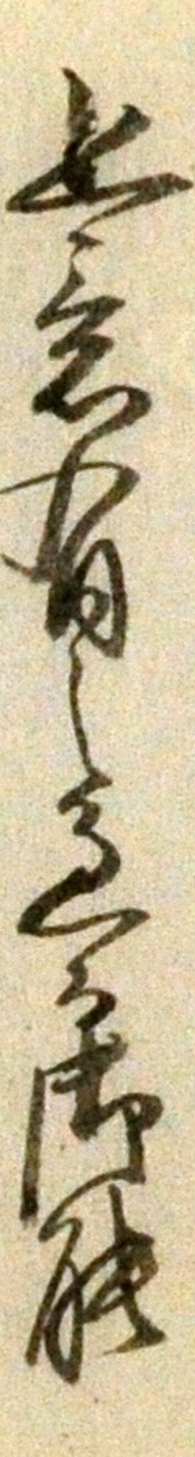上意有之過而御能
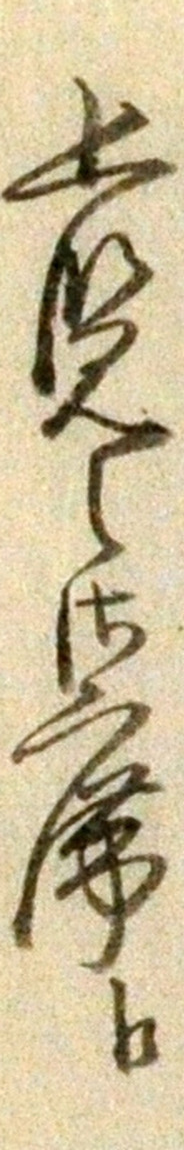上覧之御席え
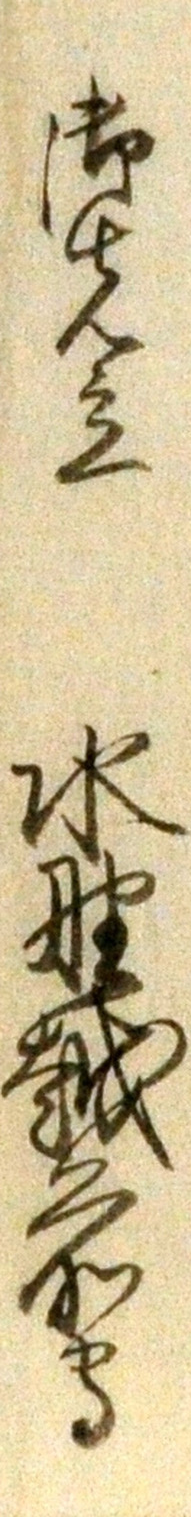御先立水野越前守
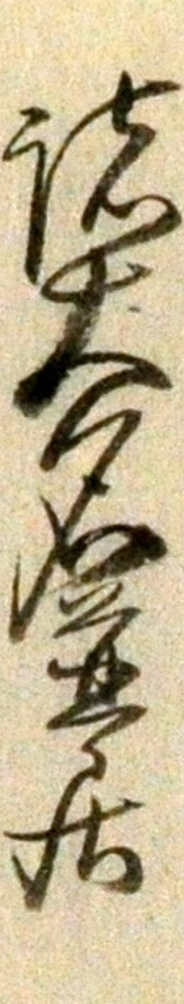諸大名並居
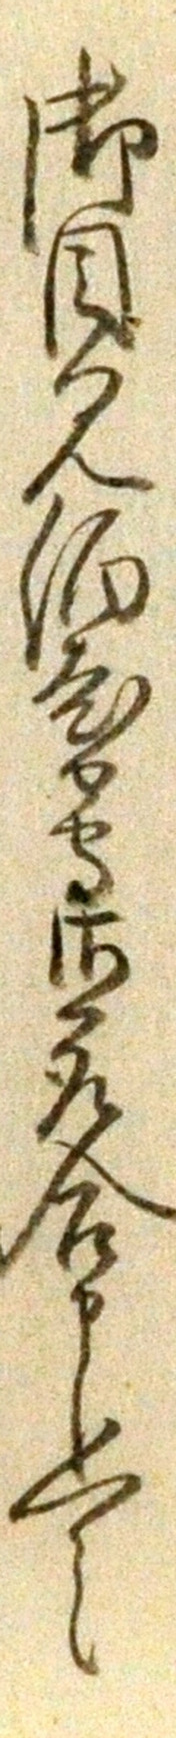御目見伯耆守御取合申上之
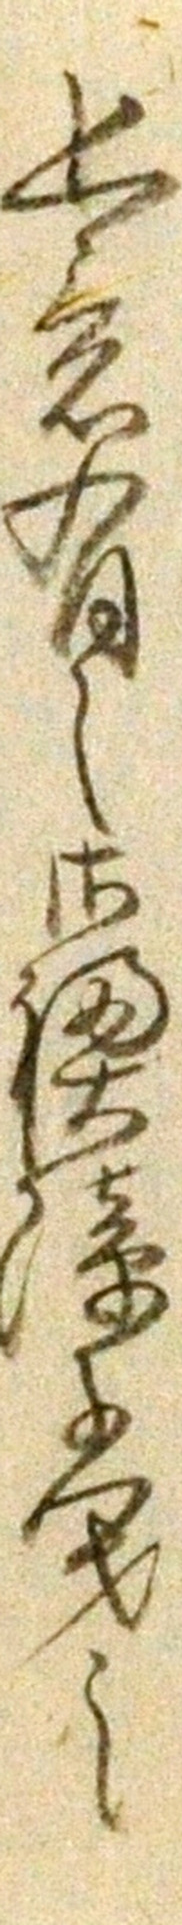上意有之御襖障子閉之
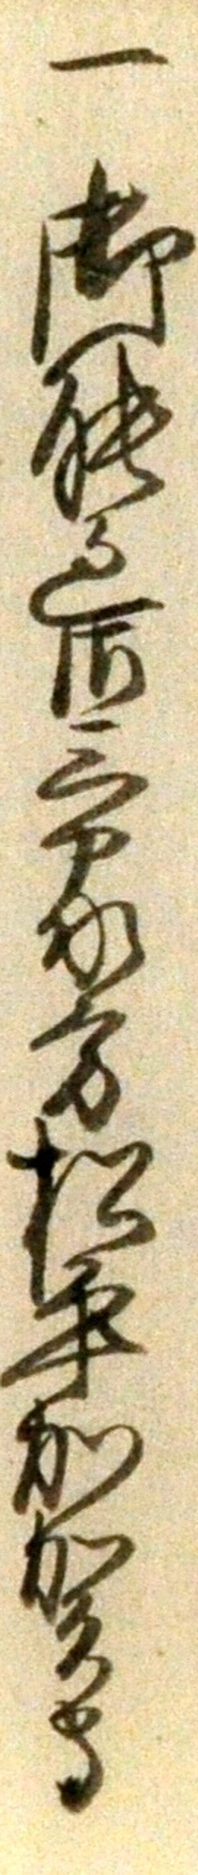一御能過御三家方松平加賀守
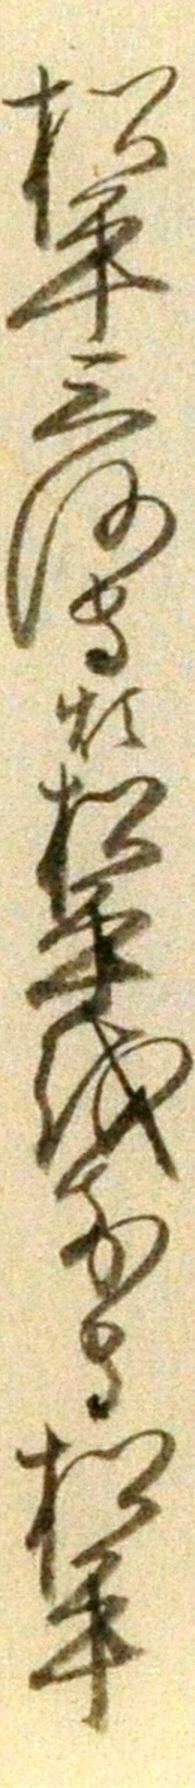松平三河守煩松平越前守松平

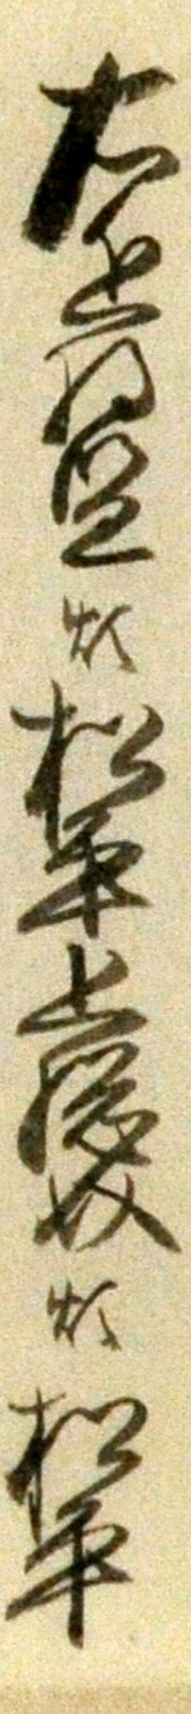右近将監煩松平上総介煩松平
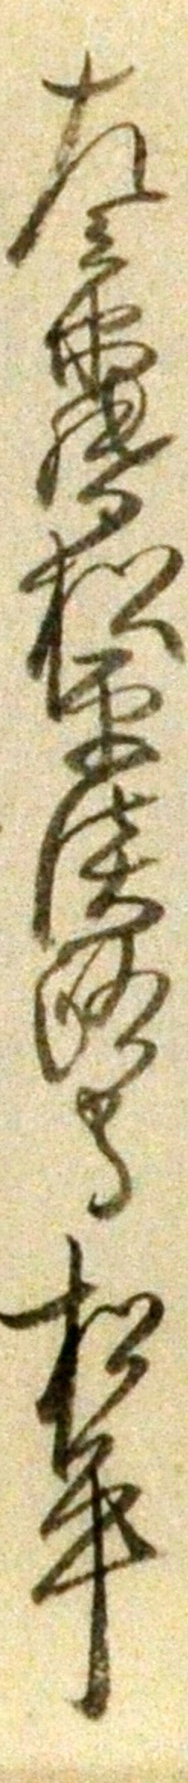左兵衛督松平淡路守松平
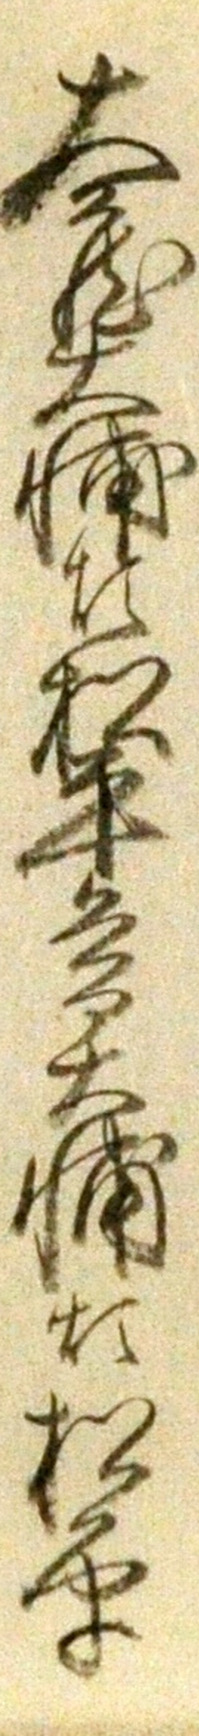大蔵大輔煩松平兵部大輔煩松平
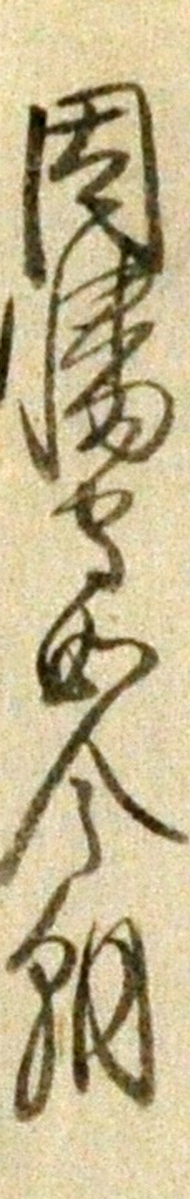因幡守如今朝
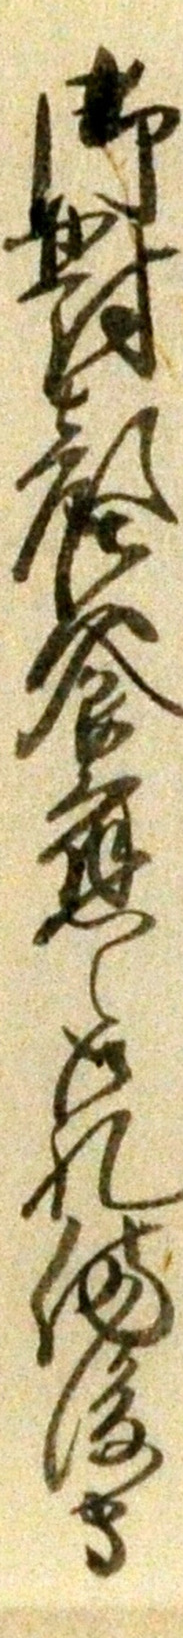御対顔御饗応之御礼備後守
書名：御馳走御能ノ節ノ留外
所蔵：伊那市立高遠町図書館・合同会社AMANE
